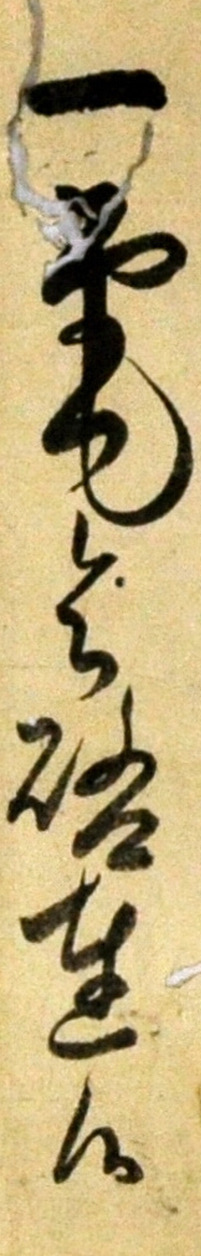一筆令啓達候
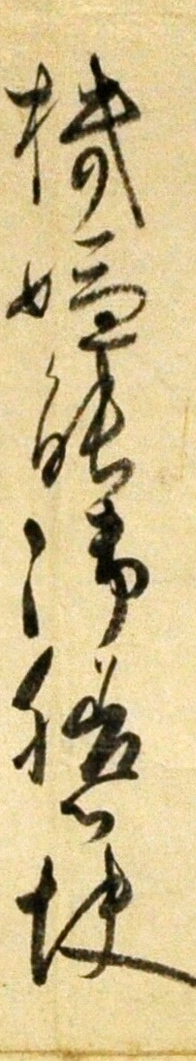機嫌能御膳御快
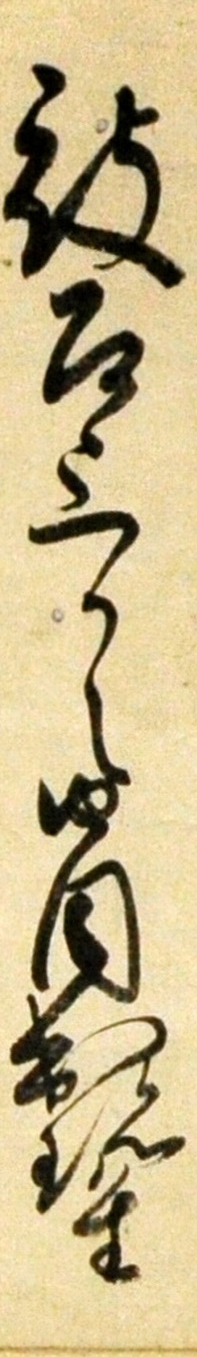被召上候之由目出珍重
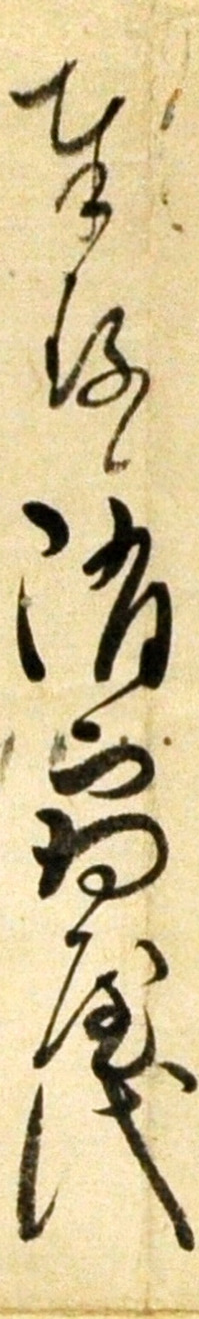奉存候随而為屋代
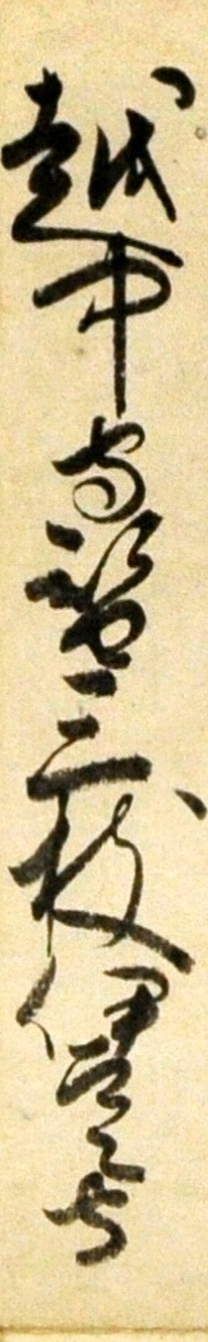越中守替三枝伊豆守
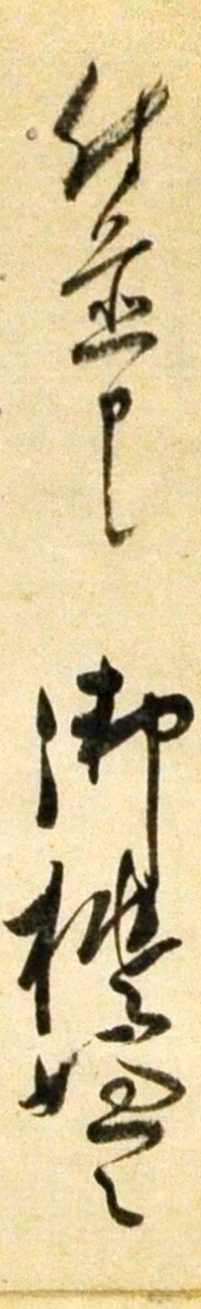付置申候御機嫌之
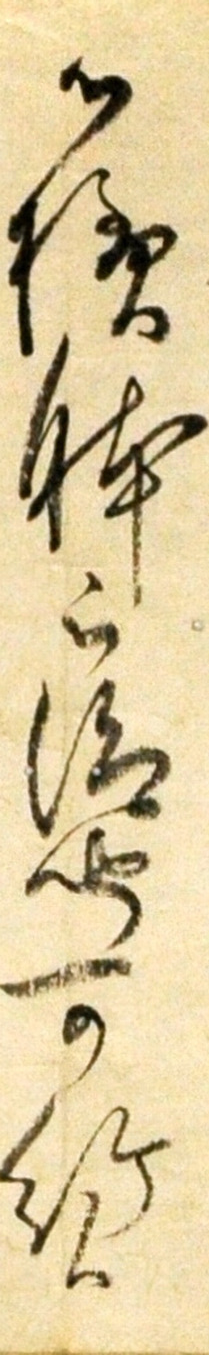御様躰被仰聞可給候
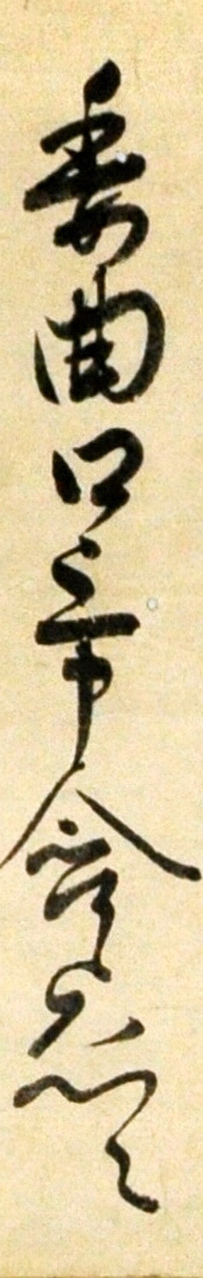委曲口上申含候恐々
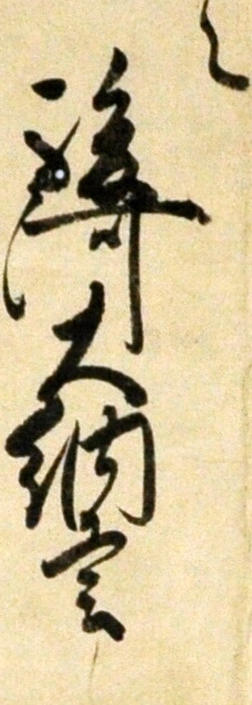駿河大納言
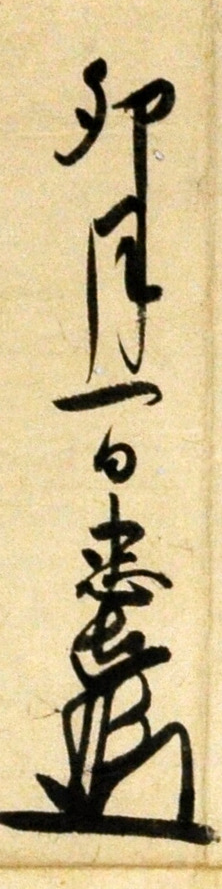卯月一日忠長
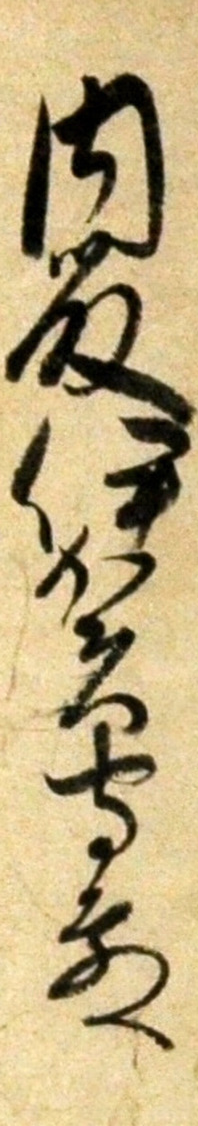内藤伊豆守殿
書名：書状
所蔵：伊那市立高遠町図書館・合同会社AMANE
